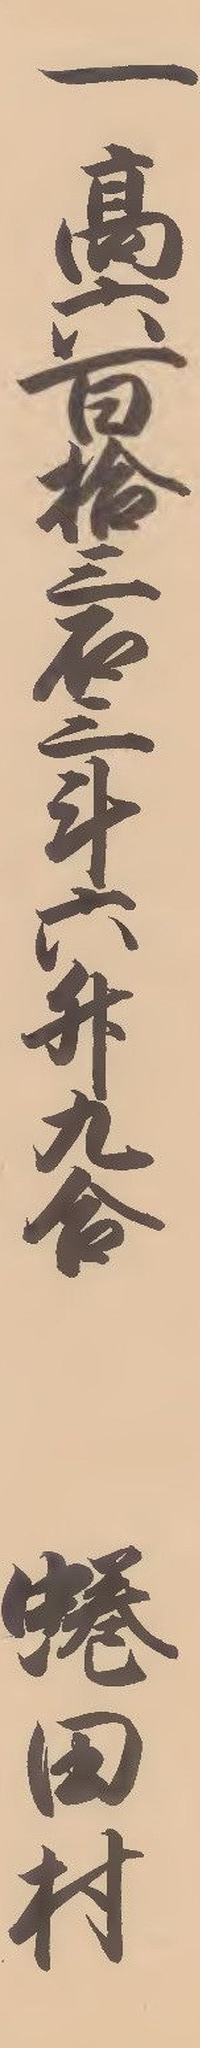一髙六百拾三石三斗六升九合蜷田村
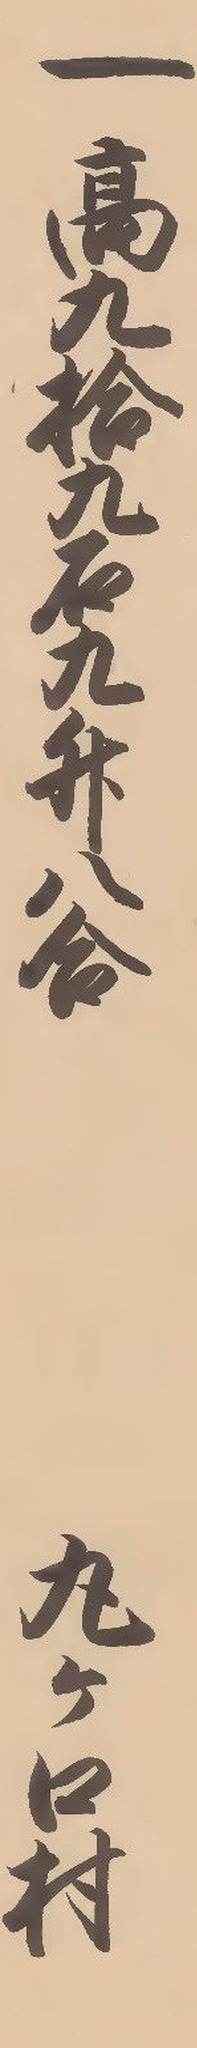一髙九拾九石九升八合丸ケ口村
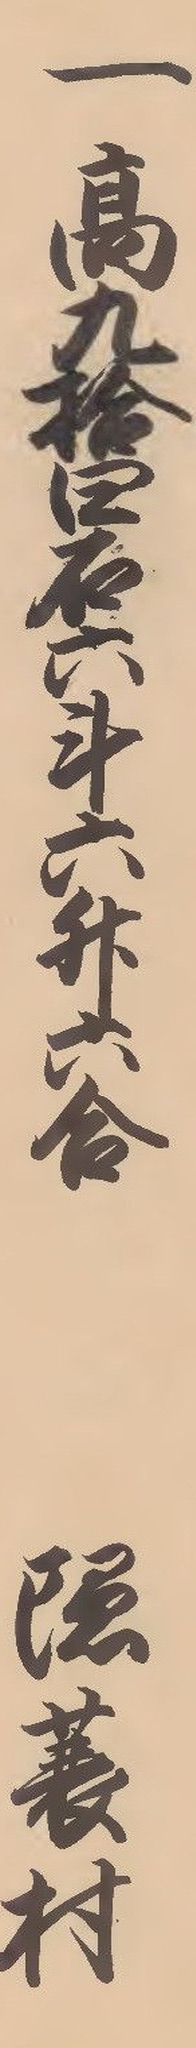一髙九拾四石六斗六升六合隠蓑村
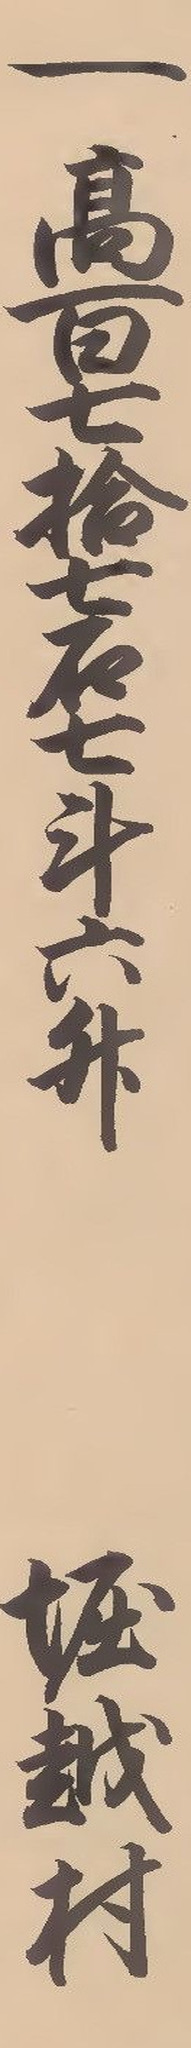一髙百七拾七石七斗六升堀越村
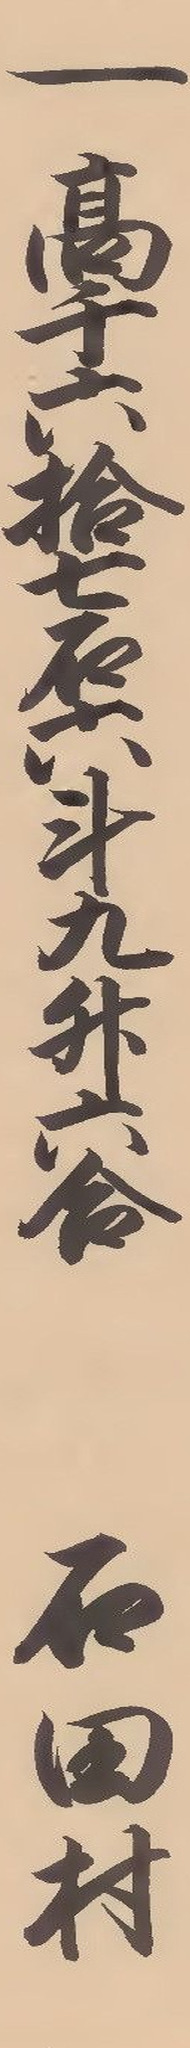一髙千六拾七石六斗九升六合石田村
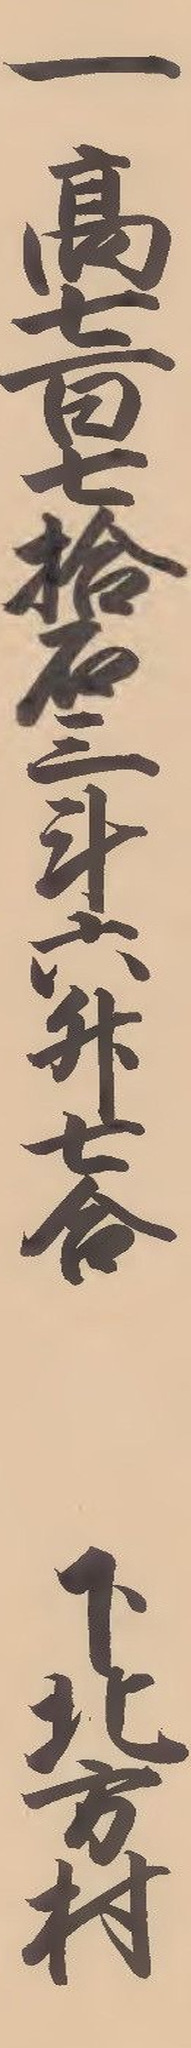一髙七百七拾石三斗六升七合下北方村
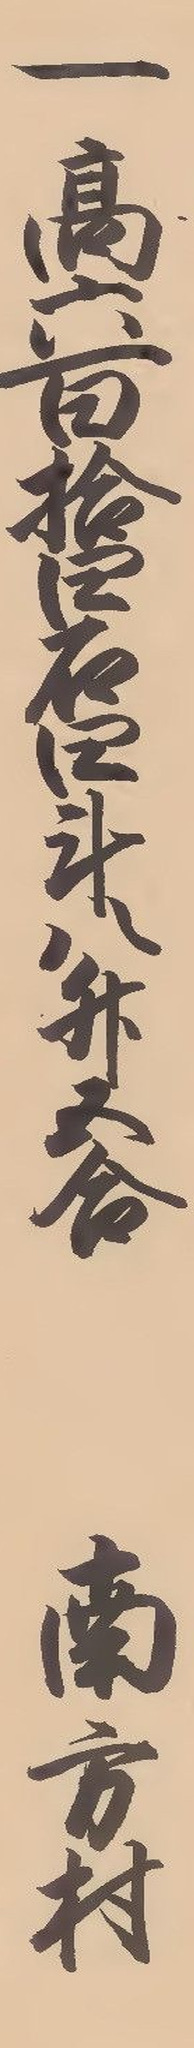一髙六百拾四石四斗八升五合南方村

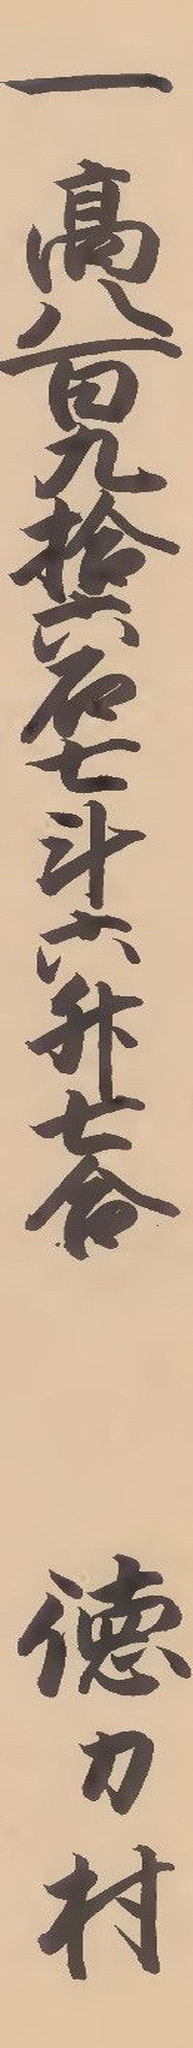一高八百九拾六石七斗六升七合徳力村
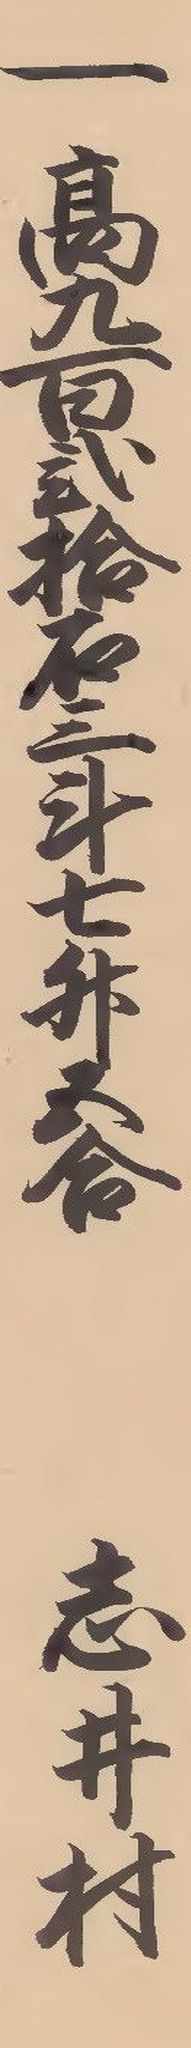一高九百弐拾石三斗七升五合志井村
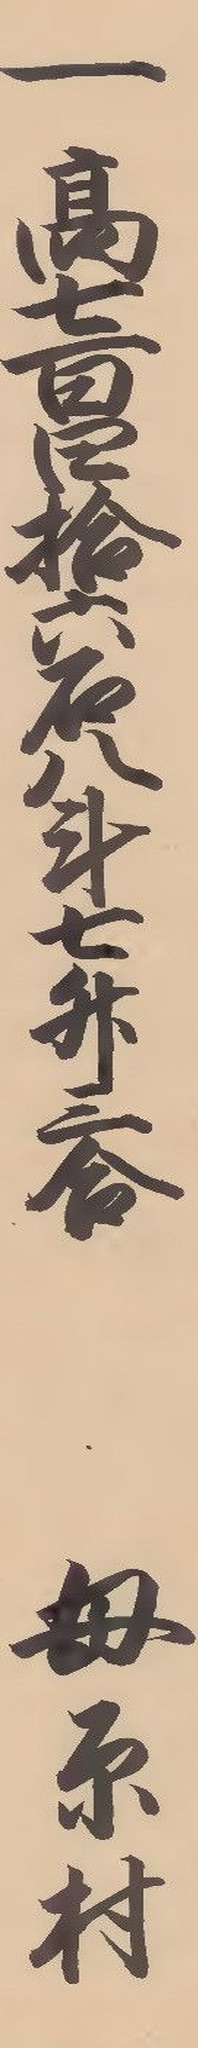一高七百四拾六石八斗七升三合母原村
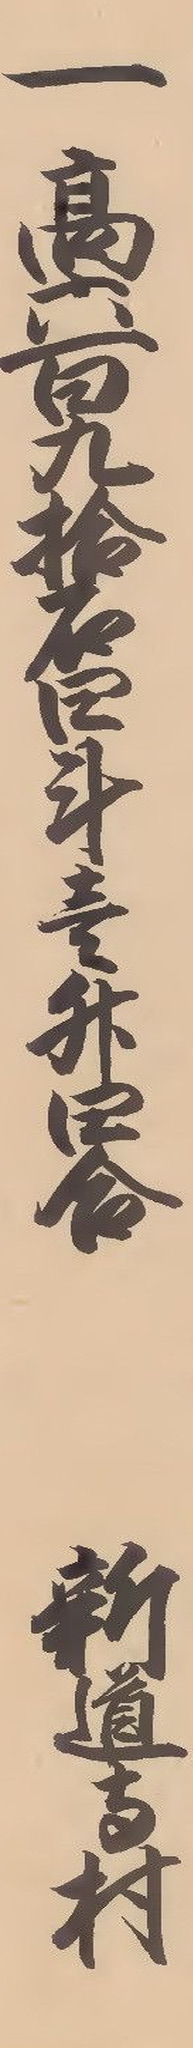一高六百九拾石四斗壱升四合新道寺村
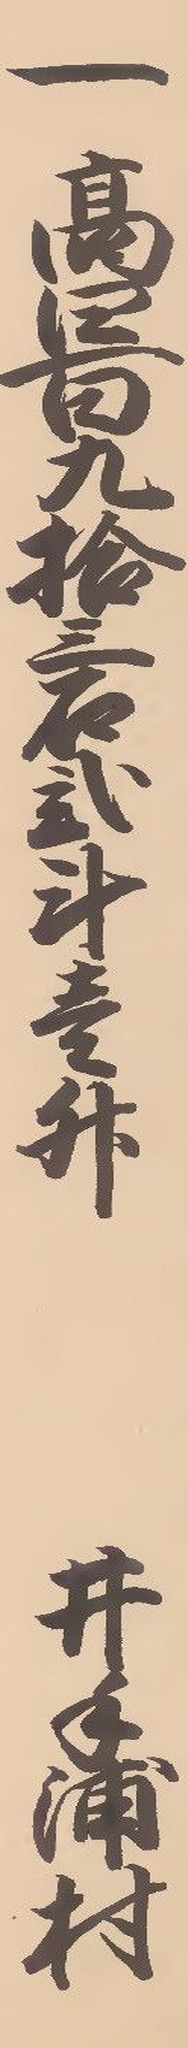一高四百九拾三石弐斗壱升井手浦村
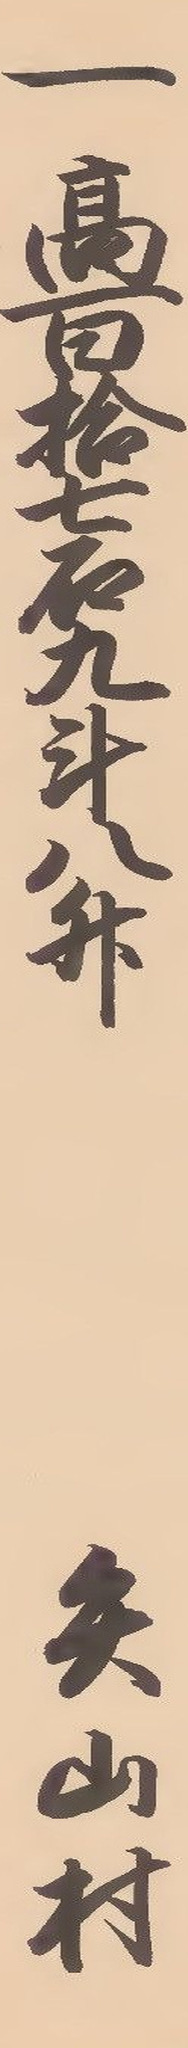一高百拾七石九斗八升矢山村
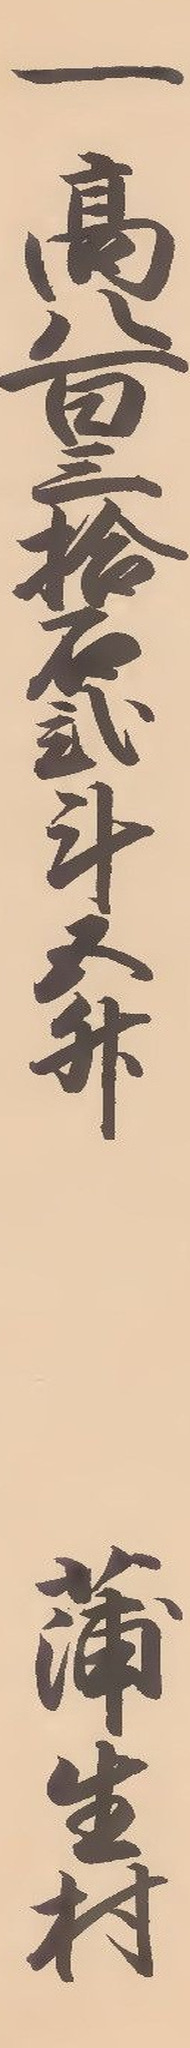一高八百三拾石弐斗五升蒲生村
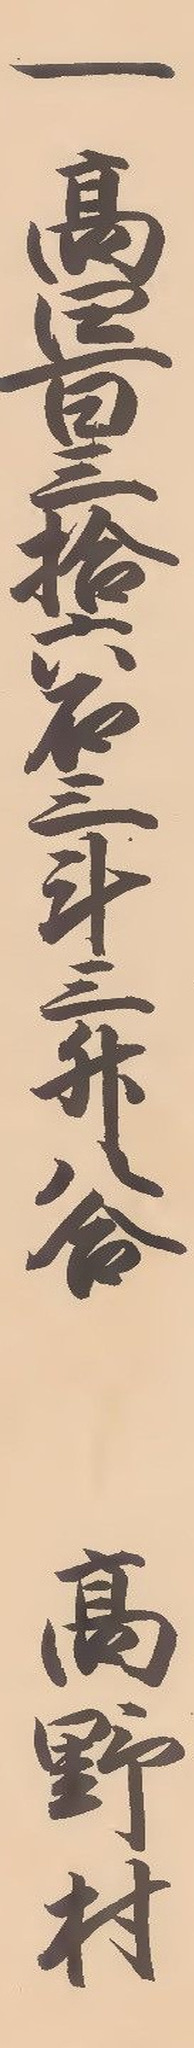一高四百三拾六石三斗三升八合髙野村

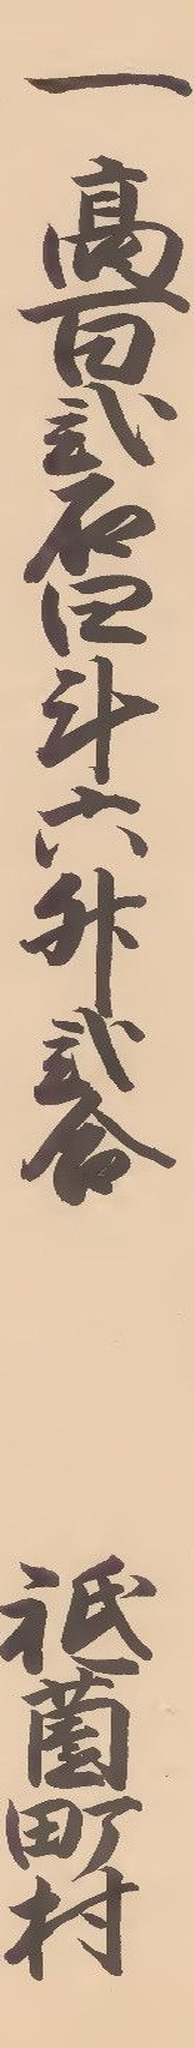一高百弐石四斗六升弐合祗薗町村
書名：豊前国郷帳
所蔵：国立公文書館 National Archives of Japan
